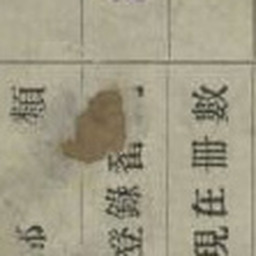登録番号
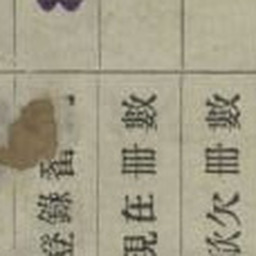現在冊数
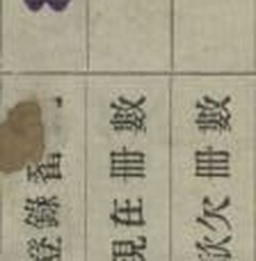現在冊数

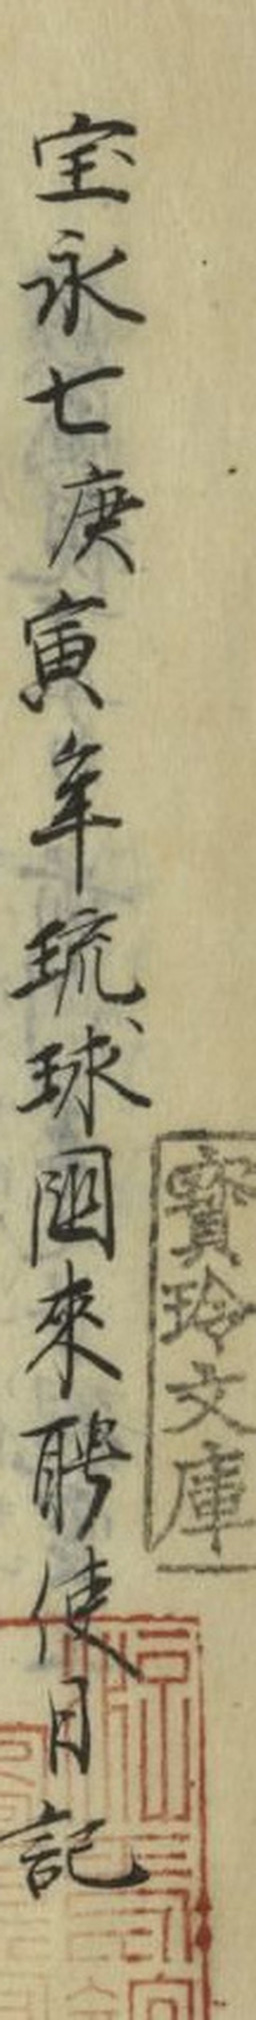宝永七庚寅年琉球国来聘使日記
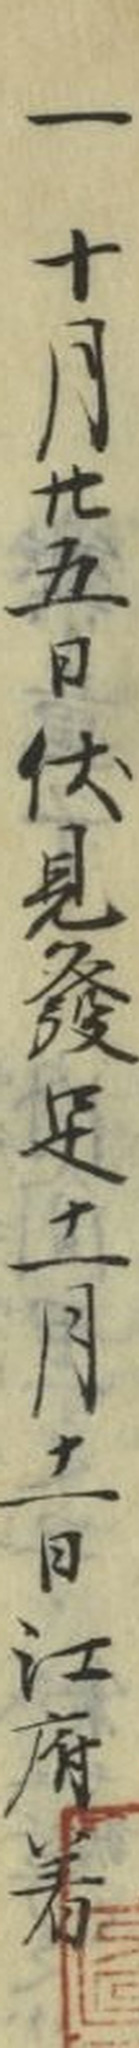一十月廿五日伏見発足十一月十一日江府着
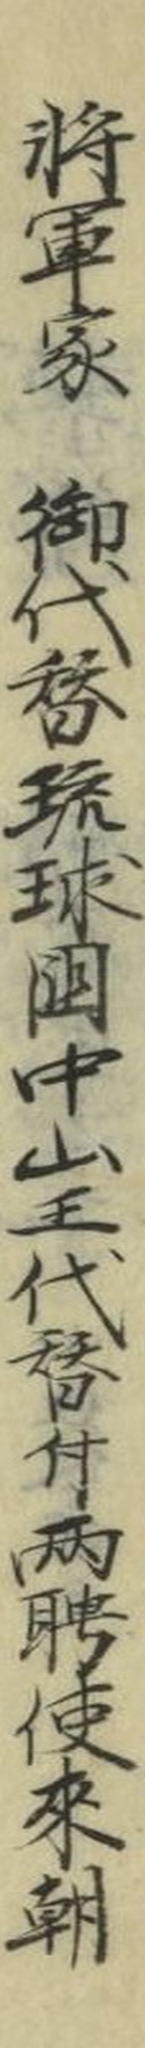将軍家御代替琉球国中山王代替付両聘使来朝
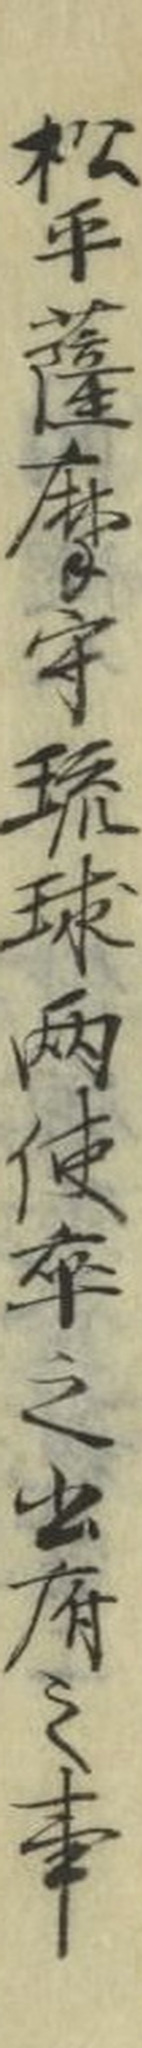松平薩摩守琉球両使卒之出府之事
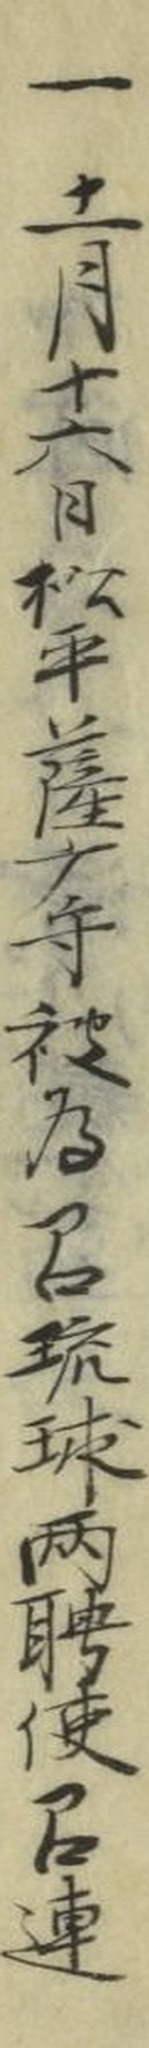一十一月十六日松平薩摩守被為召琉球両聘使召連
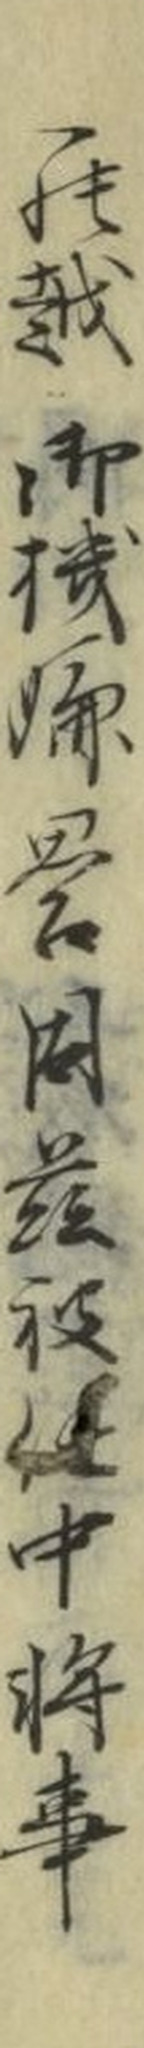罷越御機嫌思召因茲被任中将事
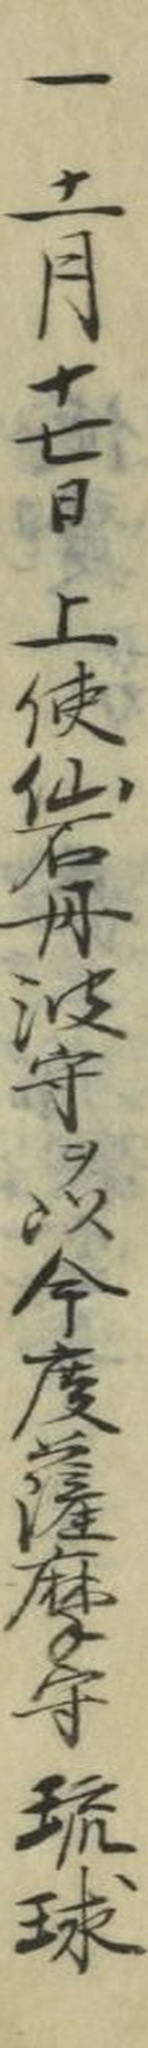一十一月十七日上使仙石丹波守を以今度薩摩守琉球
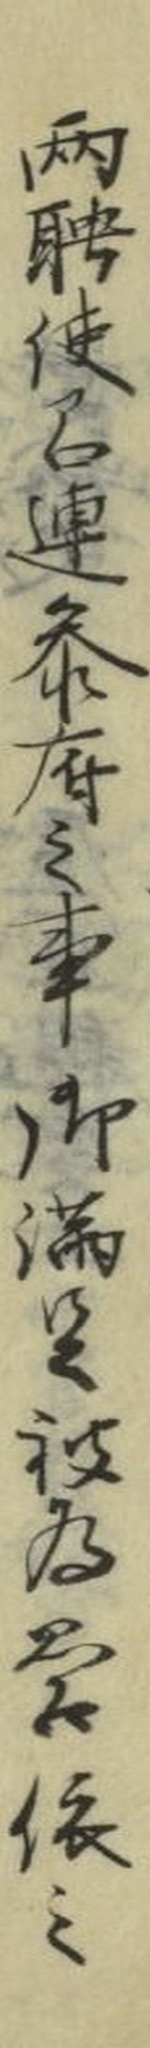両聘使召連参府之事御満足被為思召依之
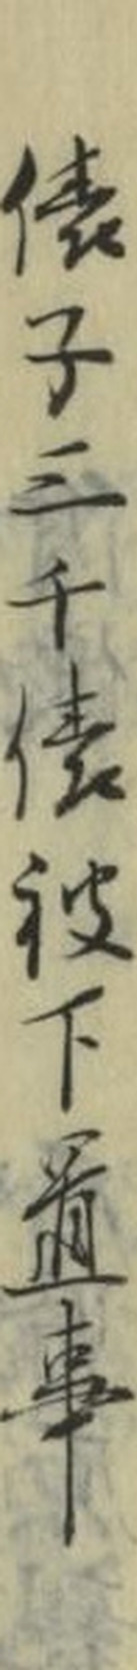俵子三千俵被下置事
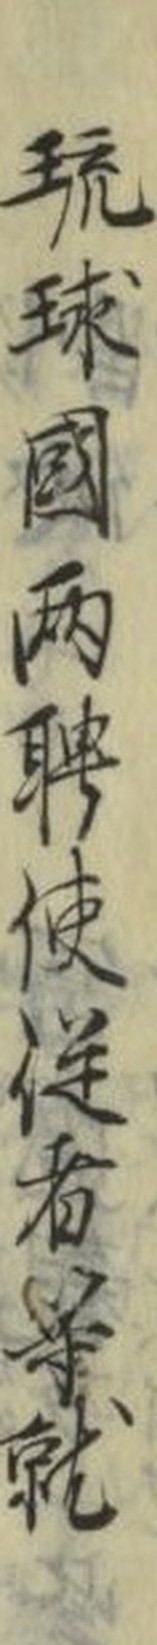琉球国両聘使従者等就
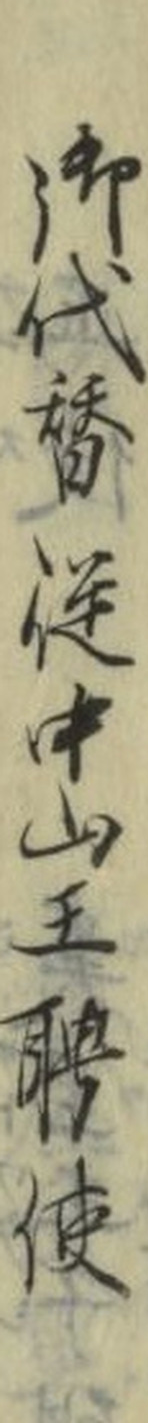御代替従中山王聘使

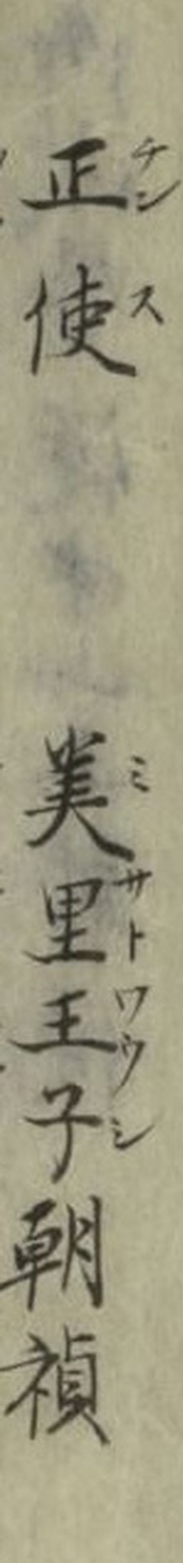正使美里王子朝禎
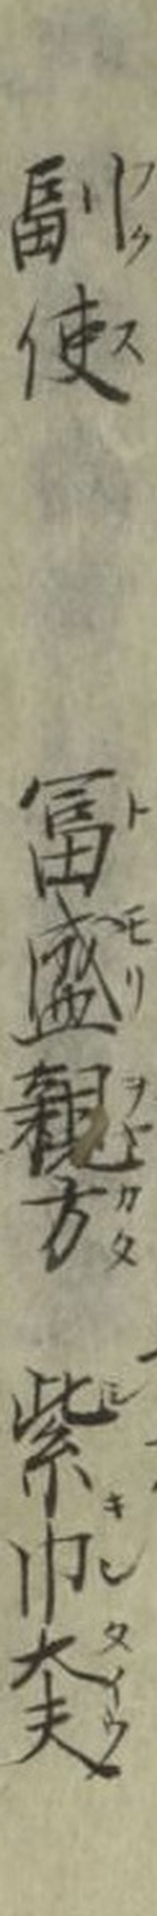副使富盛親方紫巾大夫
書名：宝永七庚寅年琉球国来聘使日記
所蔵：University of the Ryukyus Library
